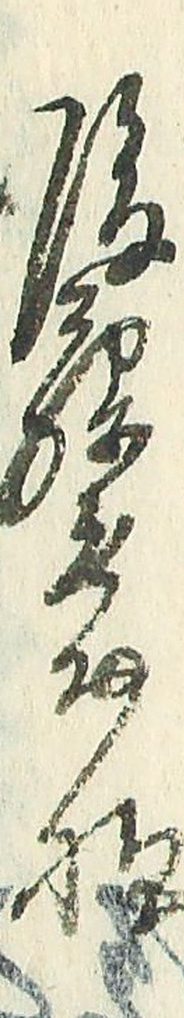後藤庄助様
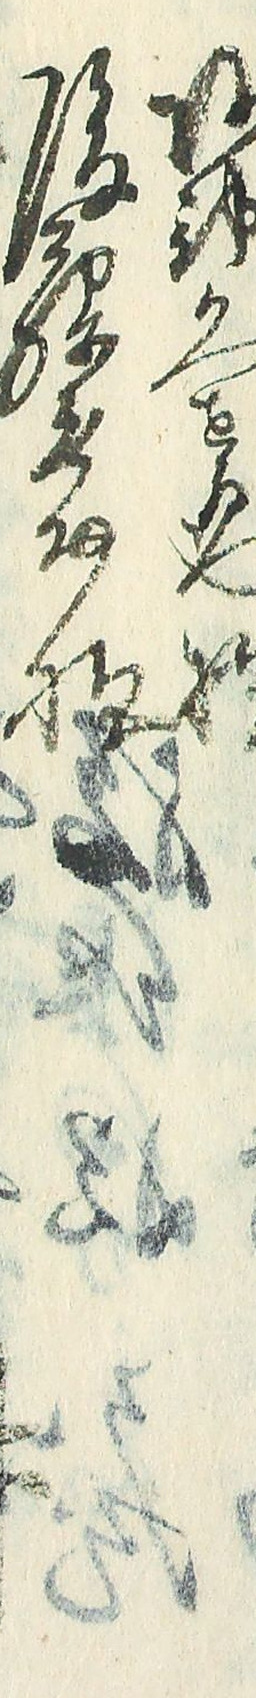後藤庄助様
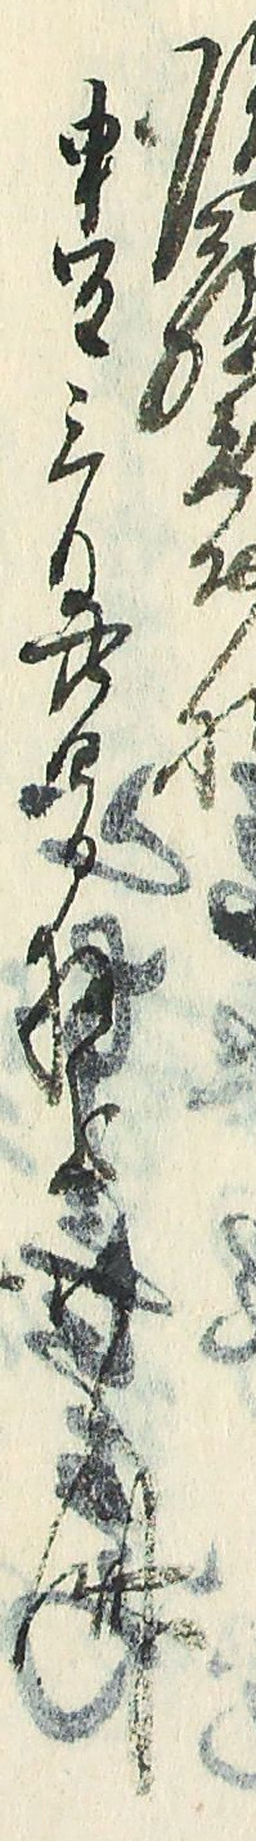申閏三月廿四日拝上仕済

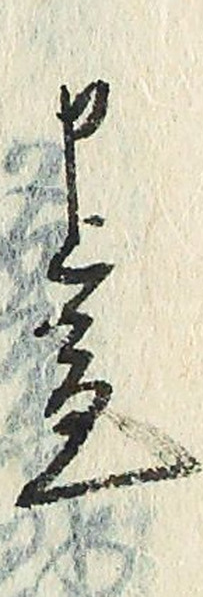申上覚
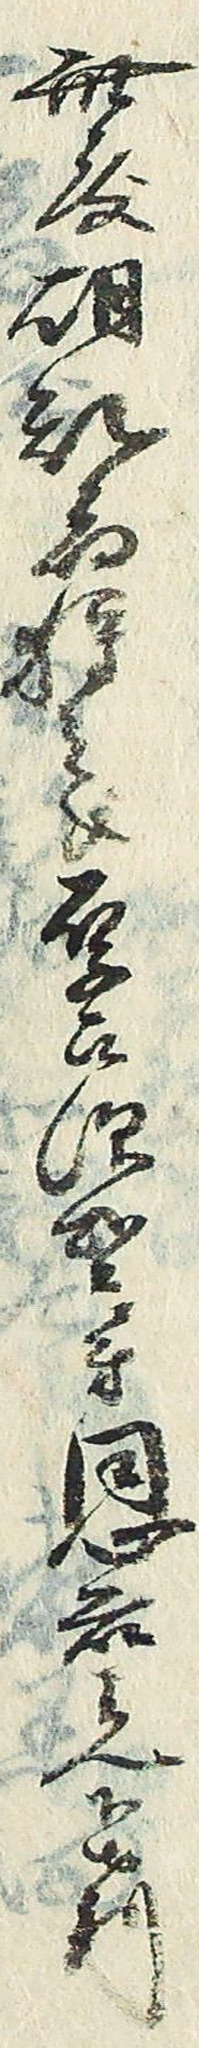此度胡乱者狩之義厚被仰出候ニ付同心衆壱人下才判
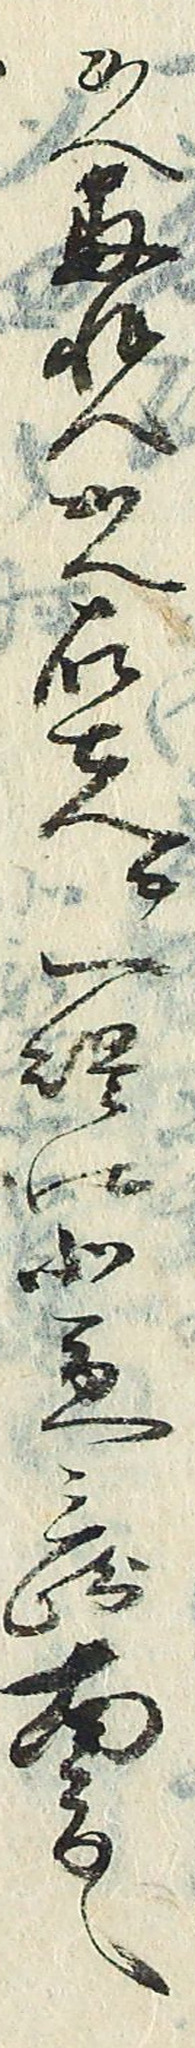弐人番非人弐人右七人ヲ一組ニ仕北方へ三崎南方へ
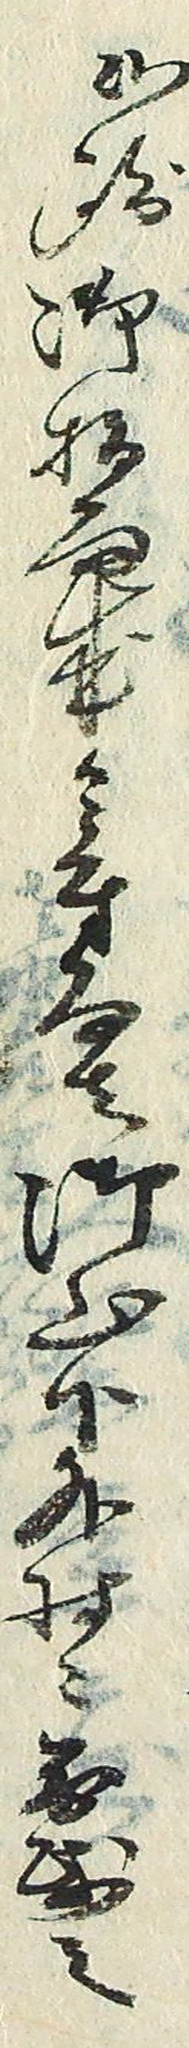弐崎御指向成候ニ付而者御山下外村々別帋之
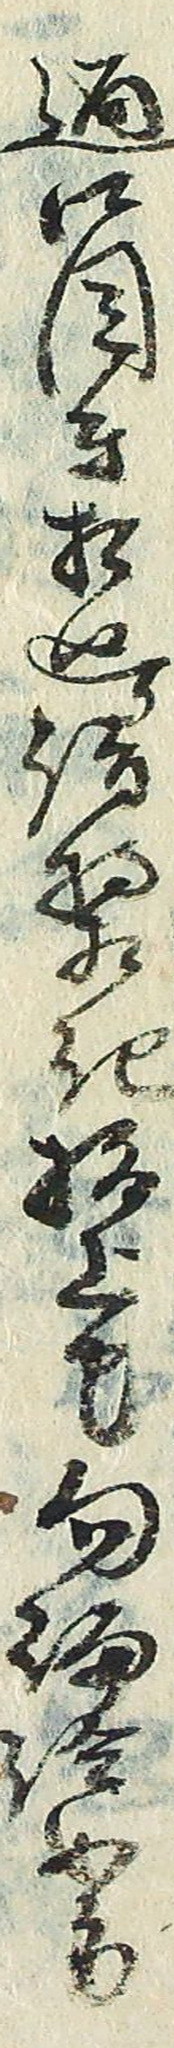通郷目付打廻り請持相記指上申候勿論詮義方
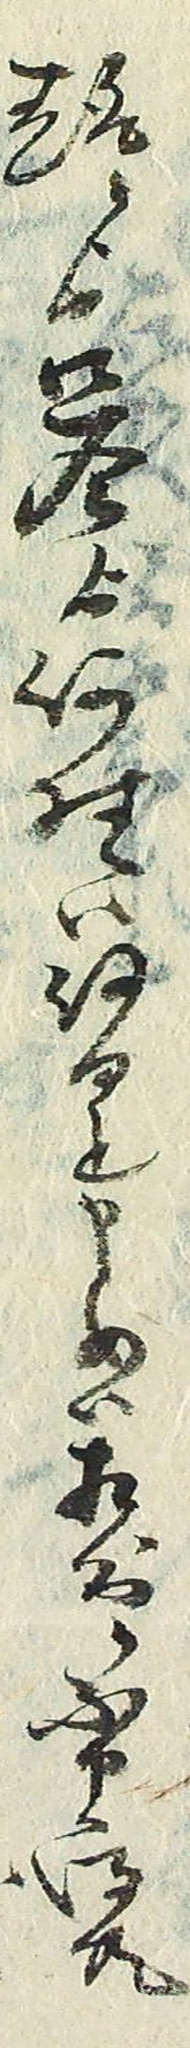趣ニゟ只今ゟ何村へハ何日と申義ハ相分り不申候得共
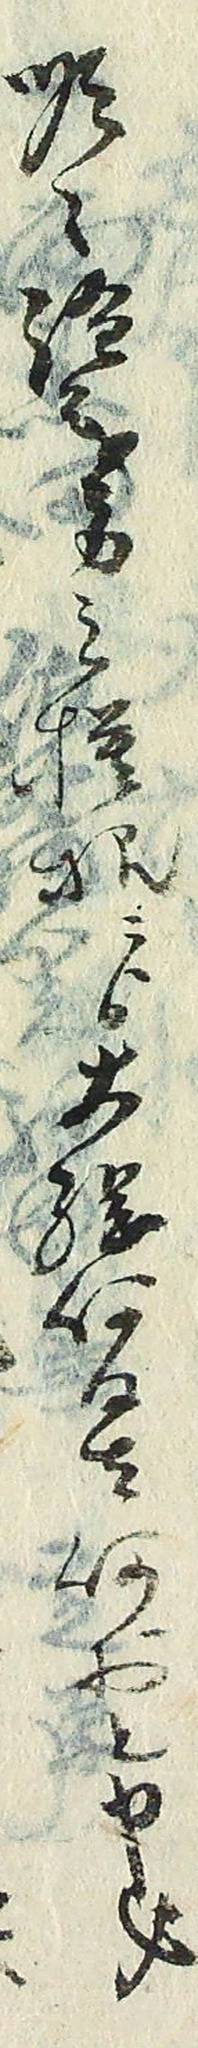順々詮義方之模様ニゟ大綱何日者何村と申義
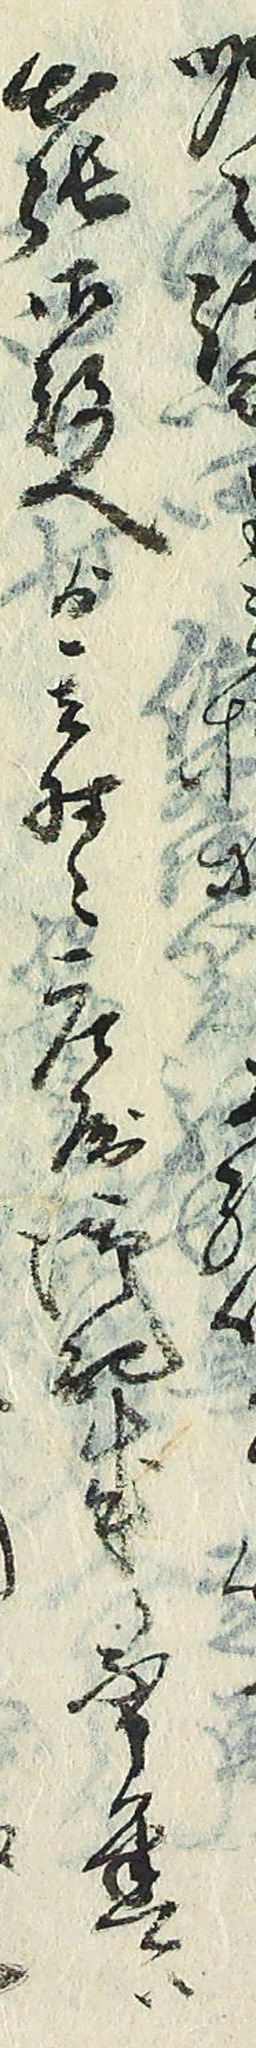出張御役人ゟ其村々庄屋へ御配成り不申達候ハ
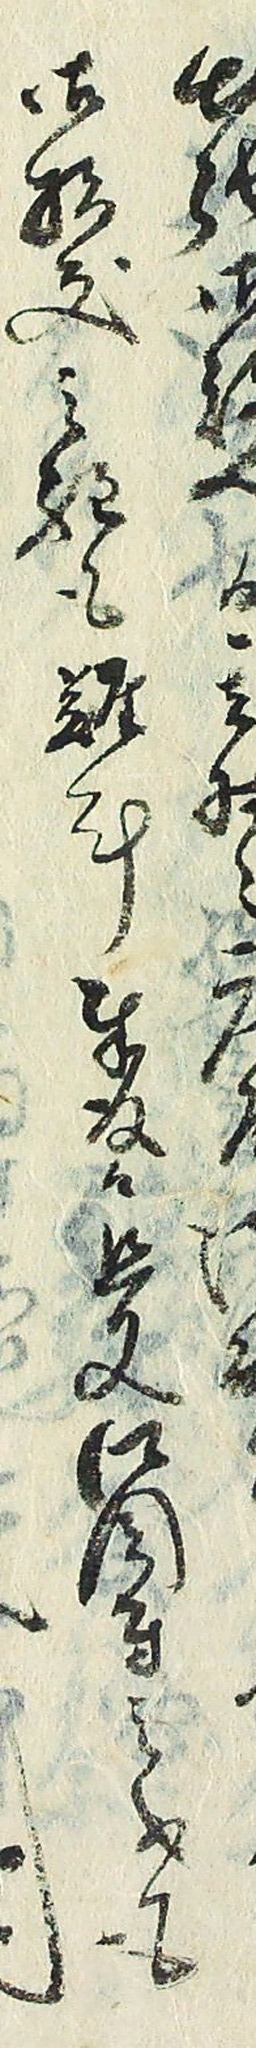御指支之程も難計奉存候且又郷目付之義も
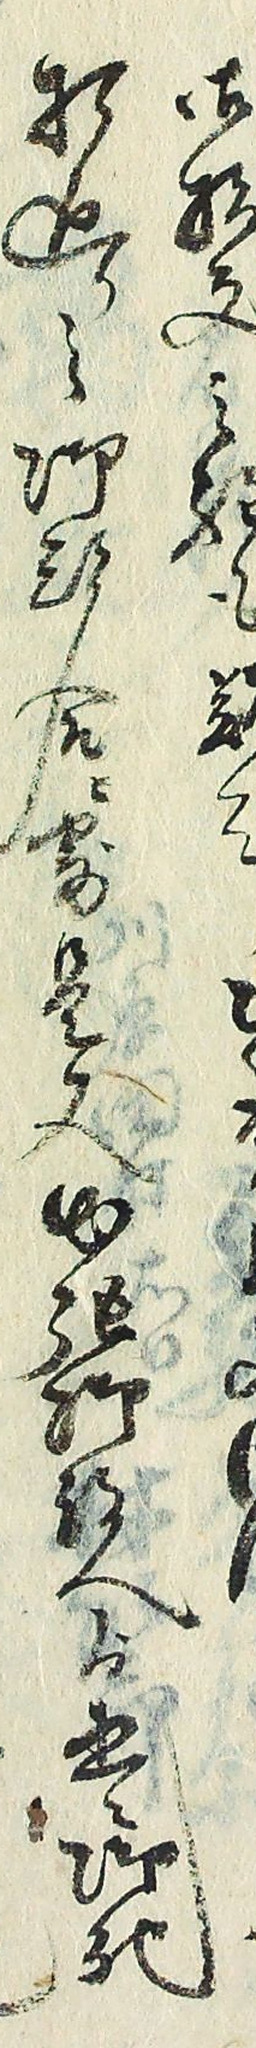打廻り之御都合ニ寄且又出張御役人ゟ直々御配
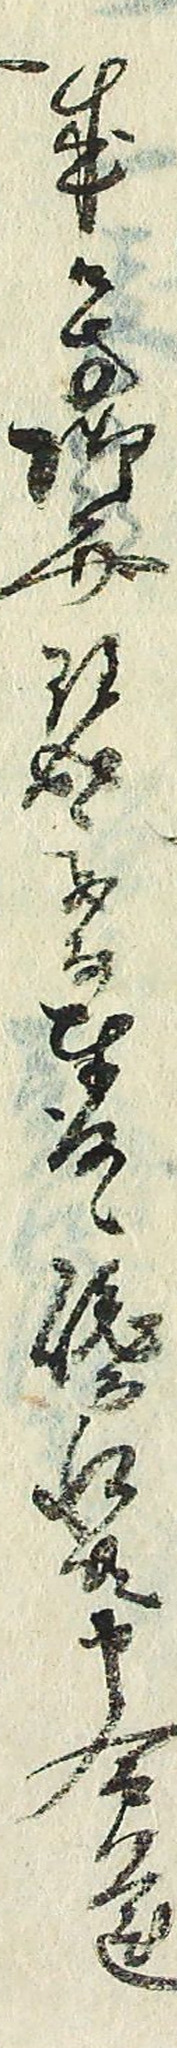成候方御弁理成候義と奉存候依而私共申合候遂
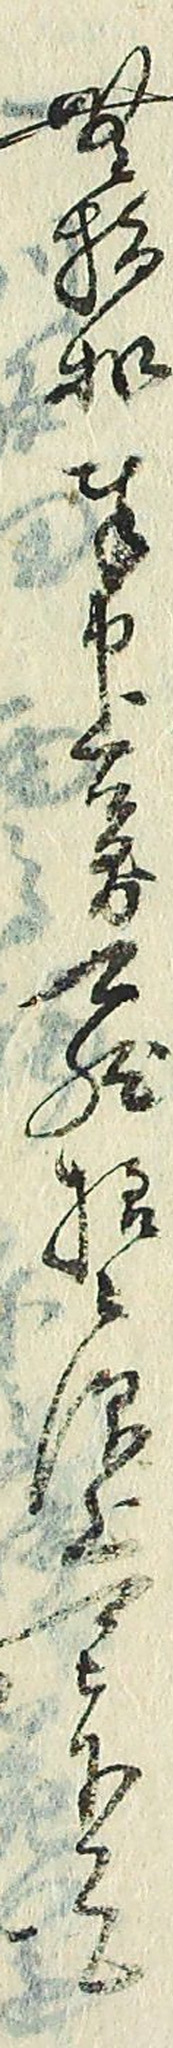無指扣奉申上候旨間可然様被仰上可被下候以上
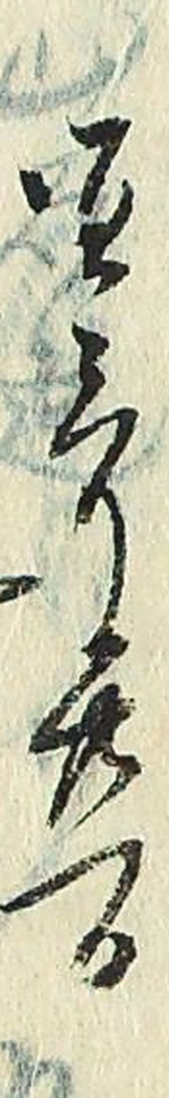閏三月廿一日
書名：諸御趣意書并御下知向之写
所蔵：鳴門教育大学 Naruto University of Education
